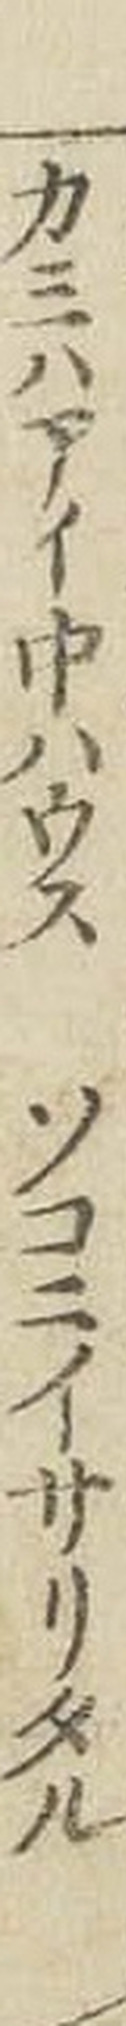カミハアイ中ハウスソコニイサリタル
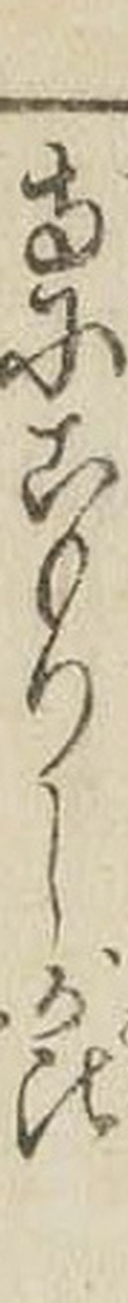寺にこもりしか比
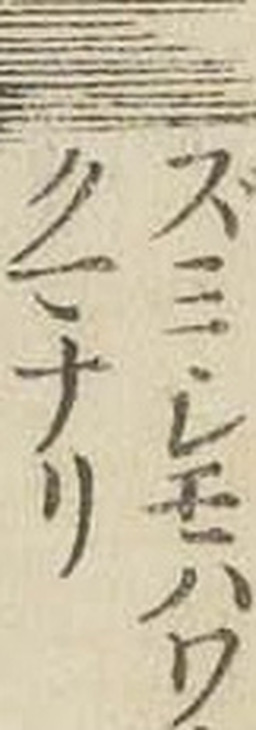クマナリ
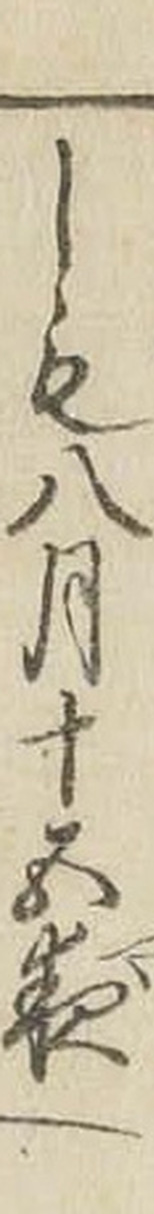しも八月十五夜
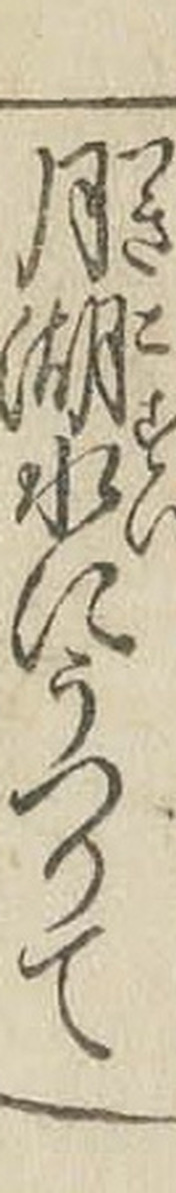月湖水にうつりて
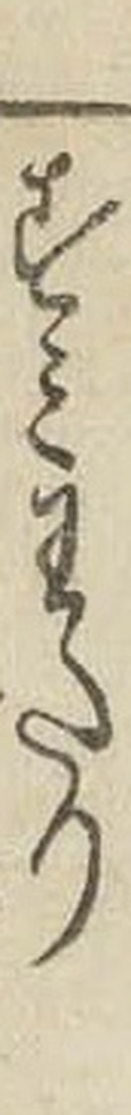すみわたり
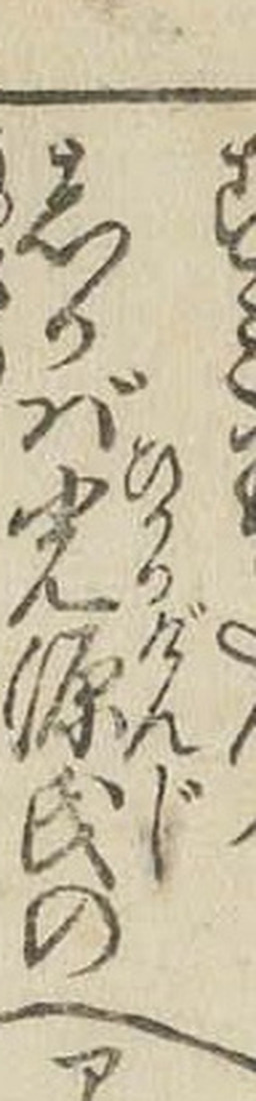しかば光源氏の
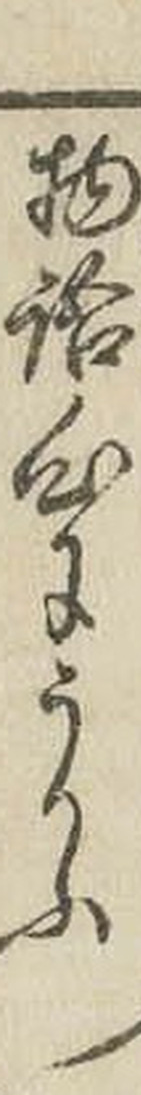物語心にうかふ
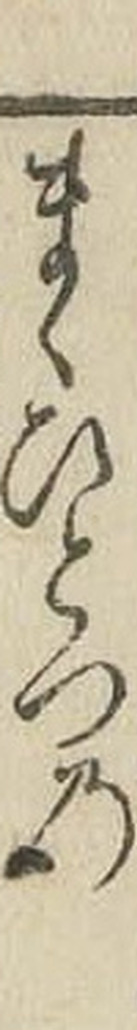まゝひとつの
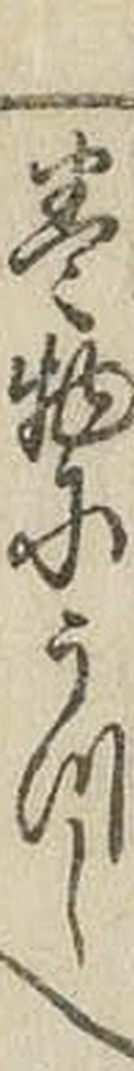巻物にうつし
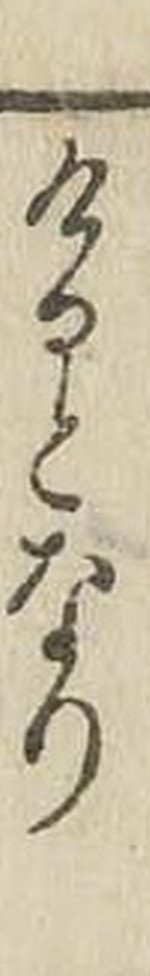けるとなり
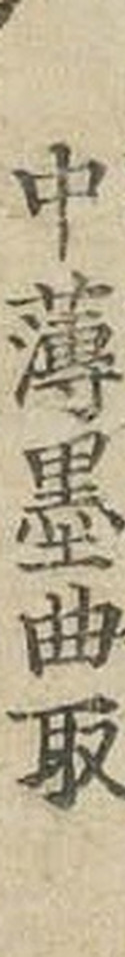中薄墨曲取

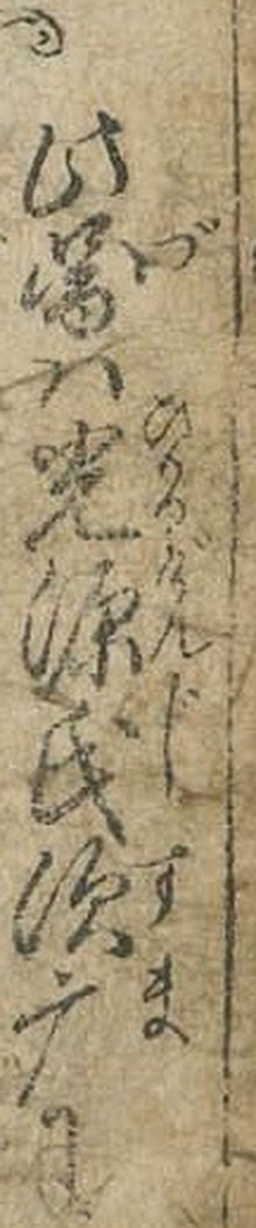此図は光源氏須磨に
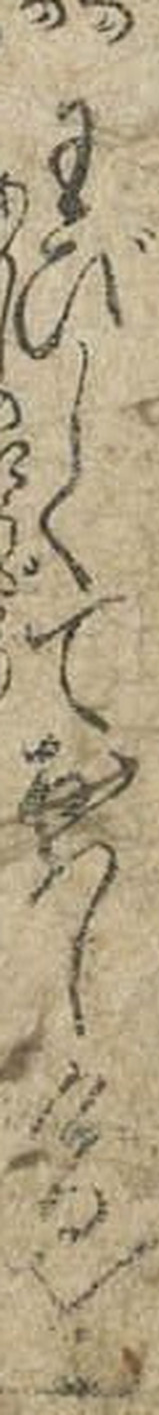わびしくておはしけるを
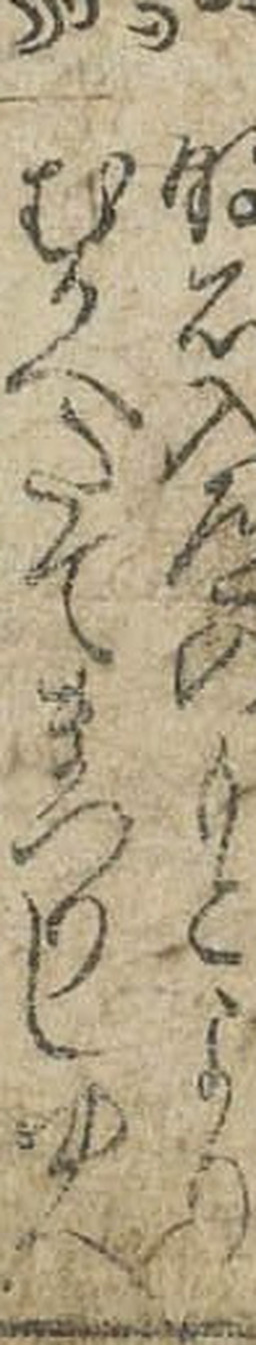むかへたてまつりしゆへ
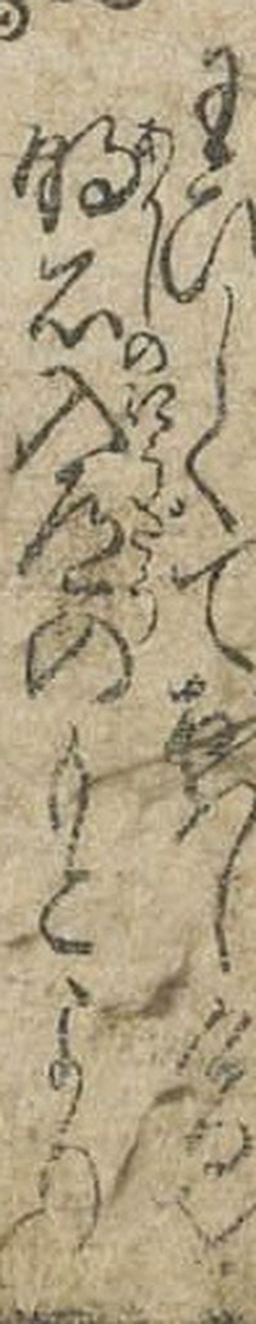明石入道のもとより
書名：絵本写宝袋 9巻 1之巻
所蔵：東京学芸大学教育コンテンツアーカイブ
